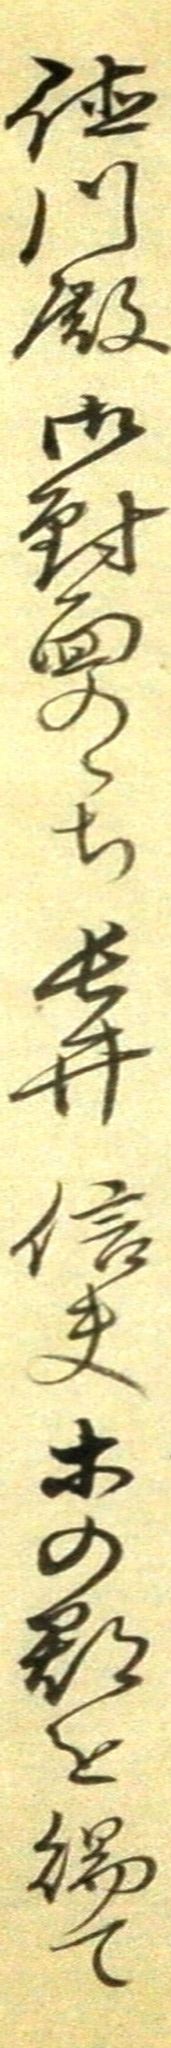徳川殿御対面のゝち長井信夫等の郡を賜て
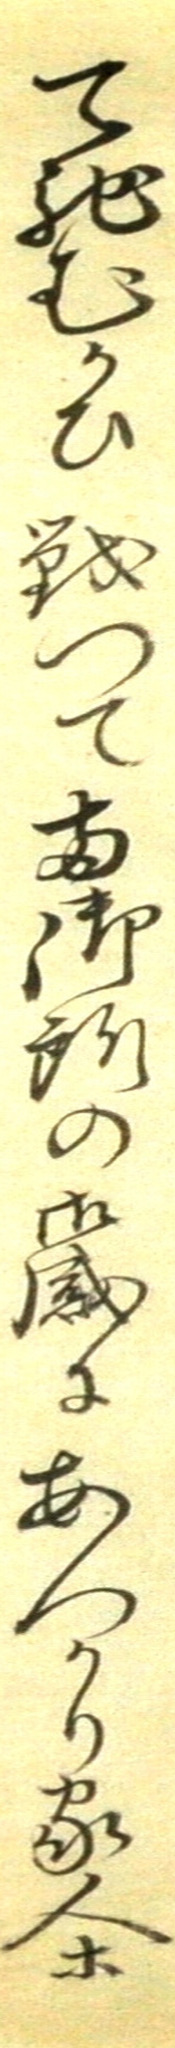て馳むかひ戦つて両御所の御感にあつかり家人等
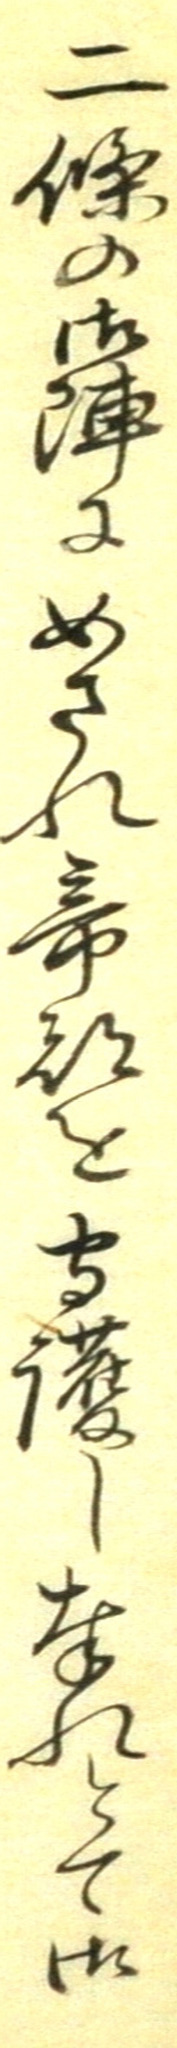二条の御陣にめされ帝都を守護し奉れとて御
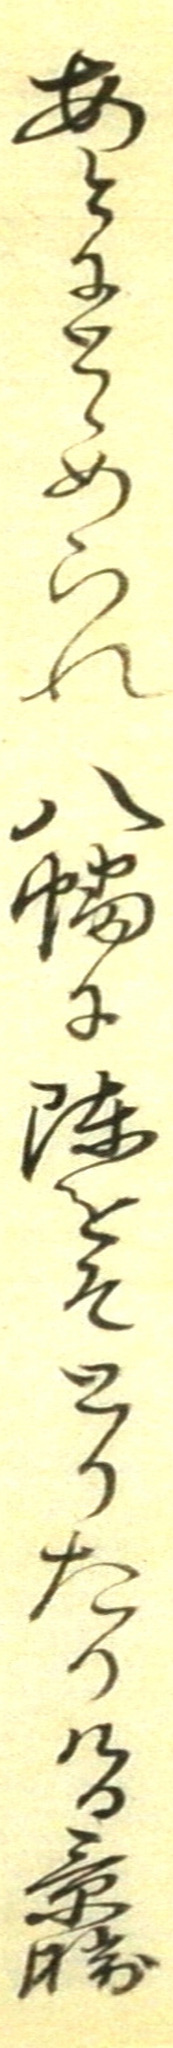あとにとゝめられ八幡に陣をそとりたりける景勝
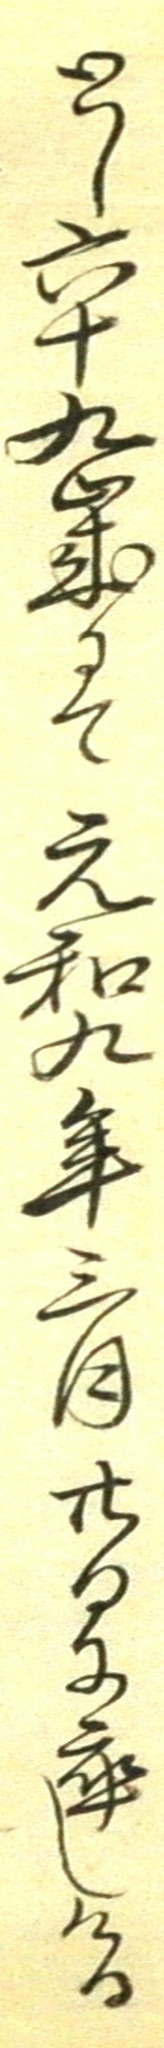とし六十九歳にて元和九年三月廿日に卒しける
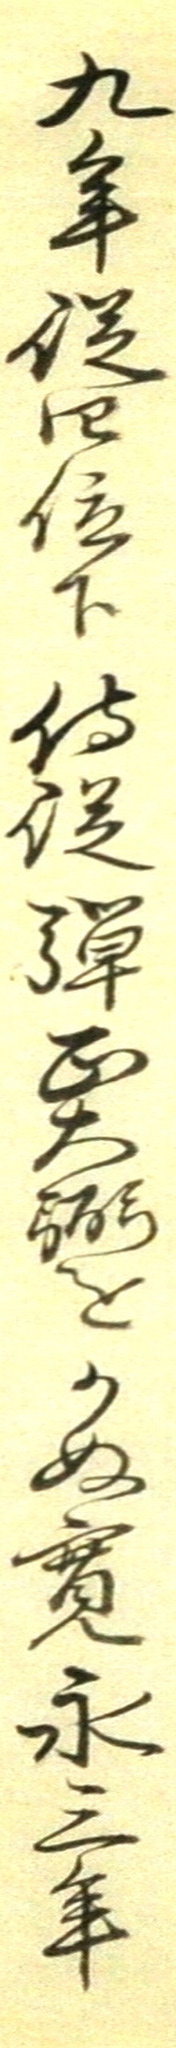九年従四位下侍従弾正大弼をかぬ寛永三年
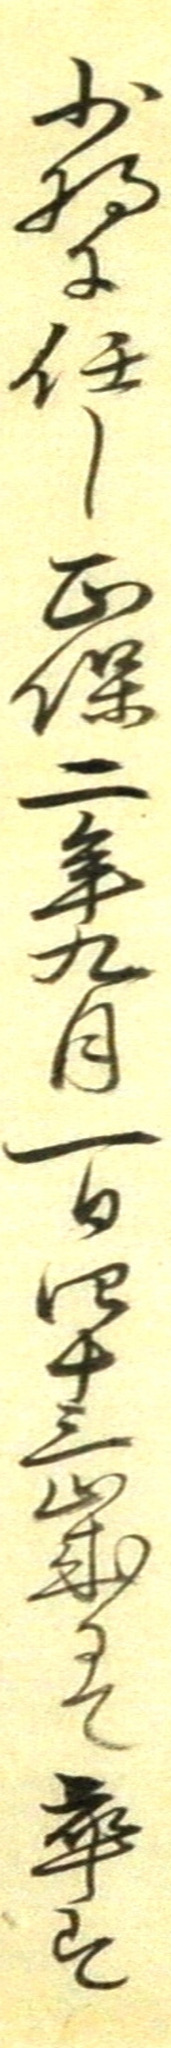少将に任し正保二年九月一日四十三歳にて卒す
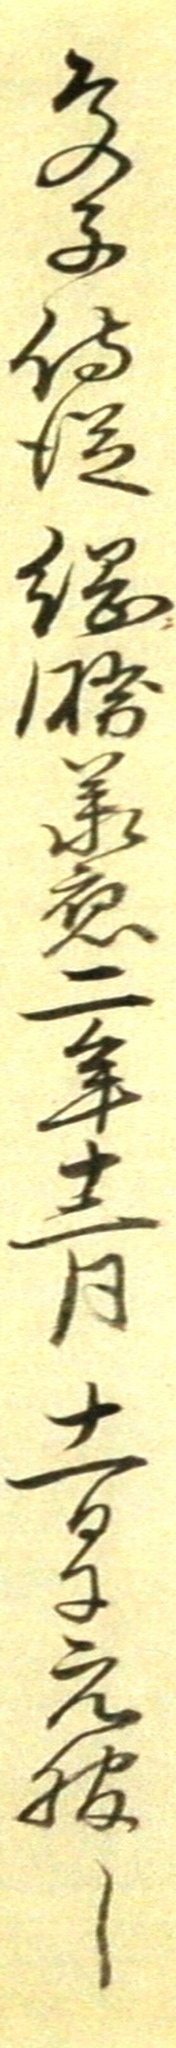その子侍従綱勝承応二年十二月十一日に元服し
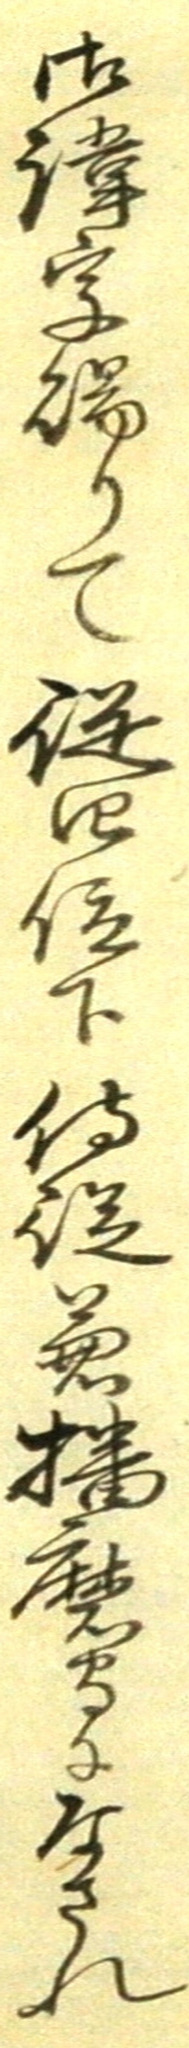御諱字賜りて従四位下侍従兼播磨守になされ
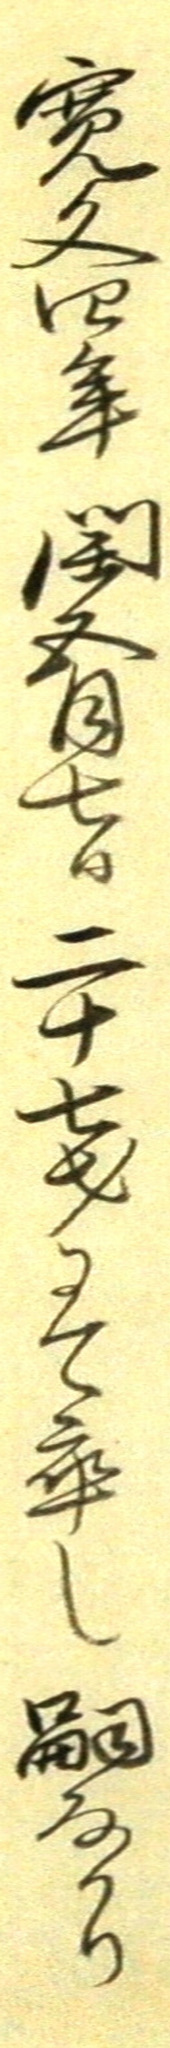寛文四年閏五月七日二十七才にて卒し嗣なかり
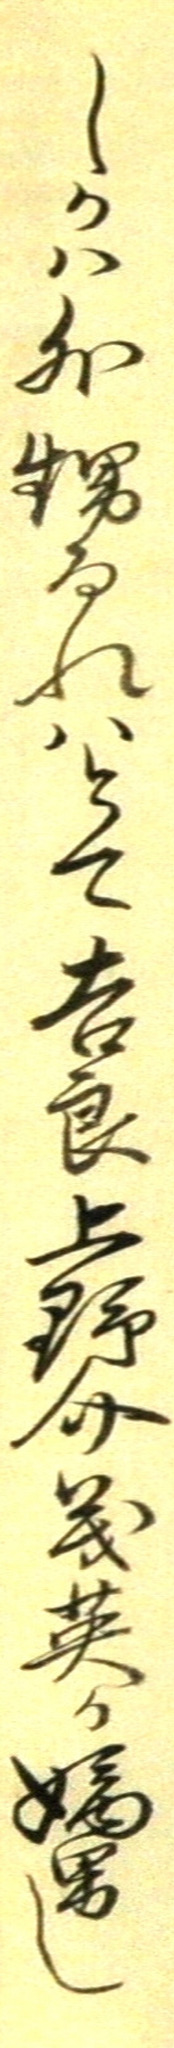しかは外甥なれはとて吉良上野介義英か嫡男し

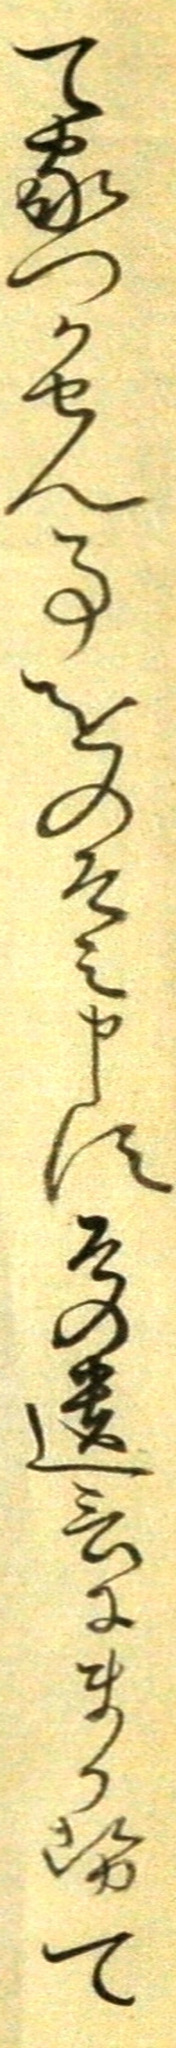て家つかせん事をのそみ申すその遺言にまかせて
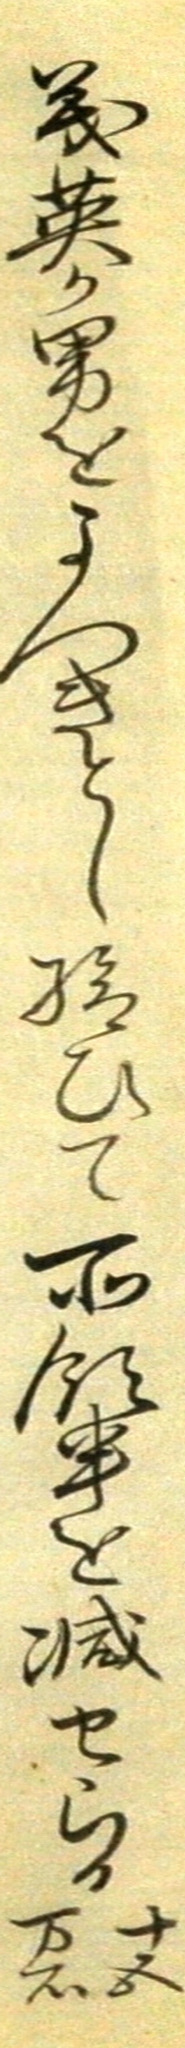義英か男をよつきとし給ひて所領半を減せらる十五万石
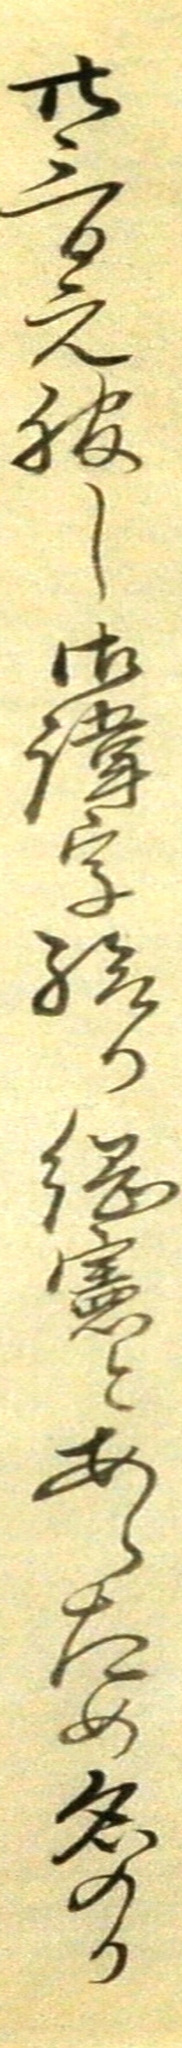廿三日元服し御諱字給り綱憲とあらため名のり
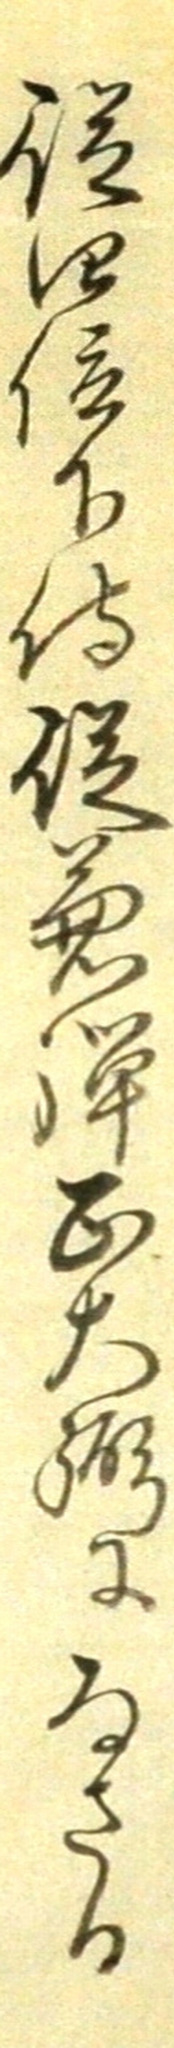従四位下侍従兼弾正大弼になさる
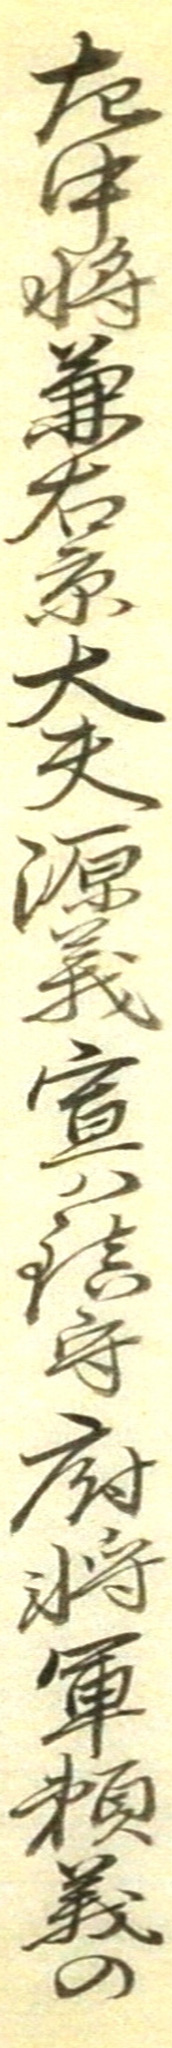左中将兼右京大夫源義宣は鎮守府将軍頼義の
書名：藩翰譜（八・下）
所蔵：伊那市立高遠町図書館・合同会社AMANE
